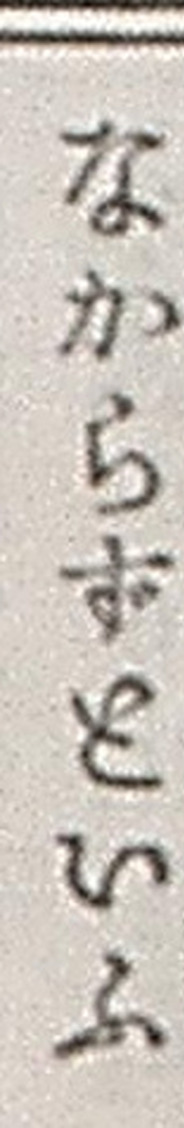なからずといふ
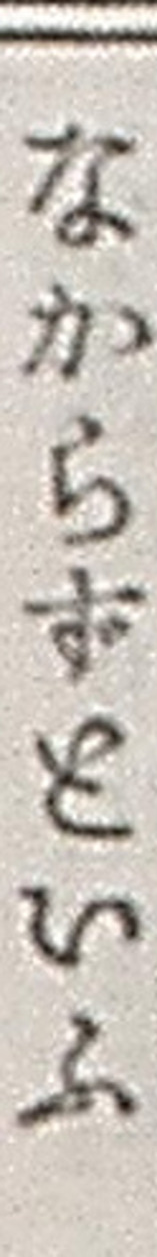なからずといふ
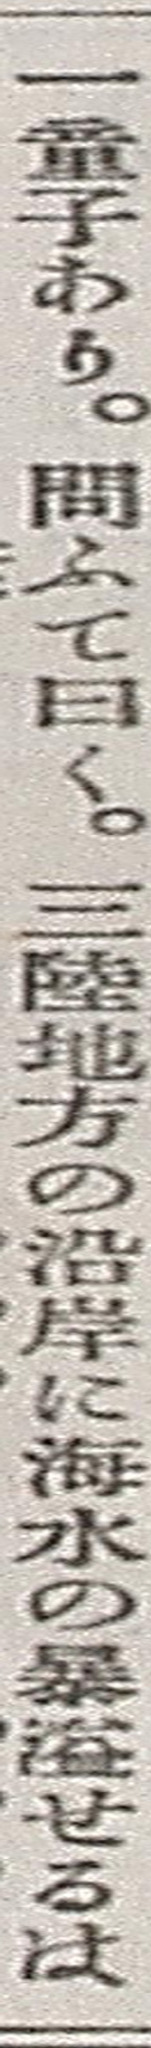一童子あり。問ふて曰く。三陸地方の沿岸に海水の暴溢せるは
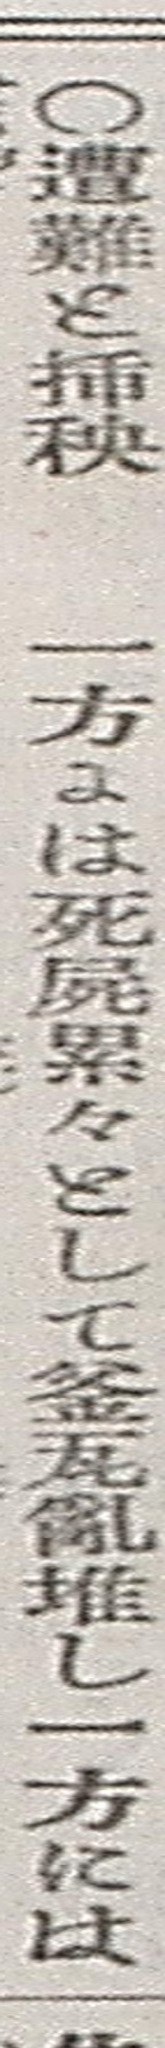○遭難と挿秧一方には死屍累々として釜瓦乱堆し一方には
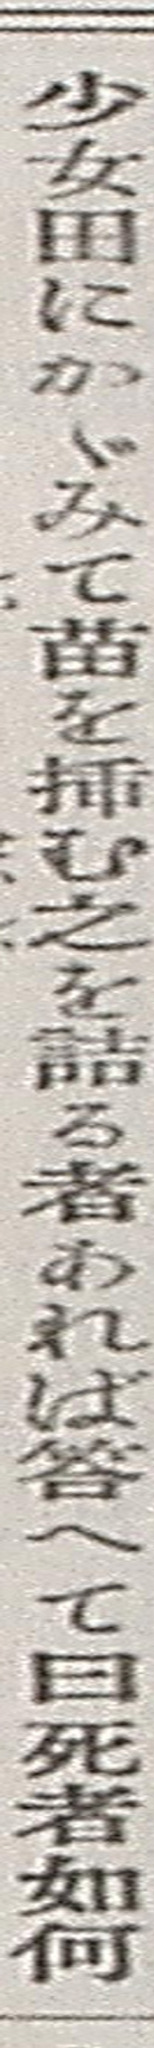少女田にかゞみて苗を挿む之を詰る者あれば答へて曰死者如何
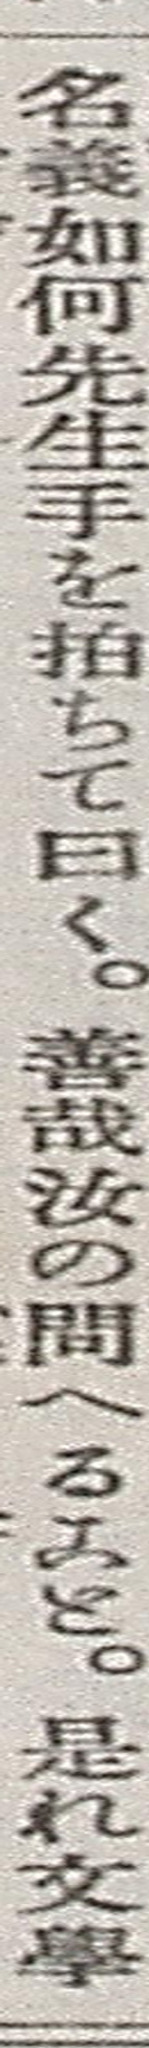名義如何先生手を拍ちて曰く。善哉汝の問へること。是れ文学
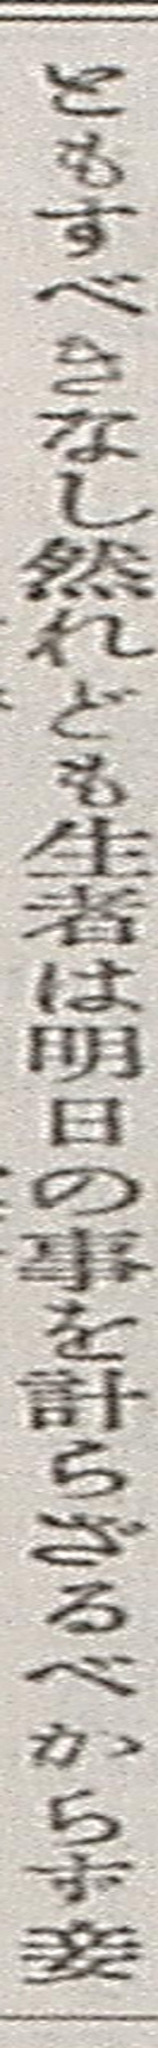ともすべきなし然れども生者は明日の事を計らざるべからず妾
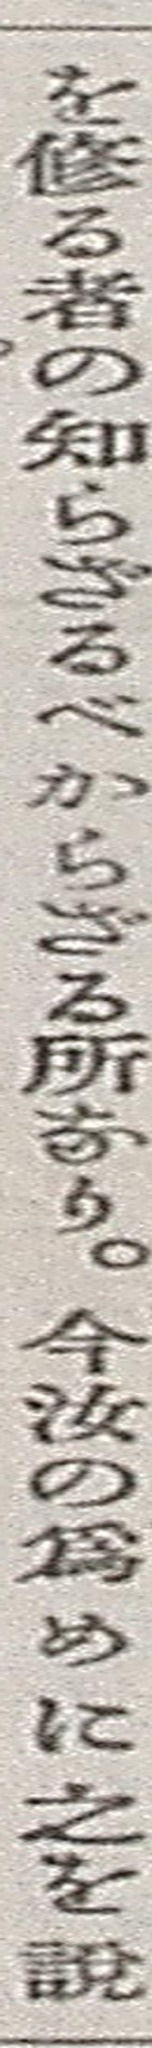を修る者の知らざるべからざる所なり。今汝の為めに之を説
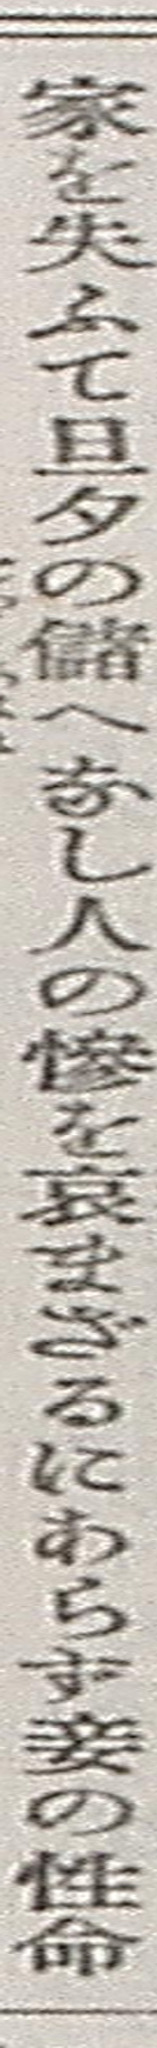家を失ふて旦夕の儲へなし人の惨を哀まざるにあらず妾の性命
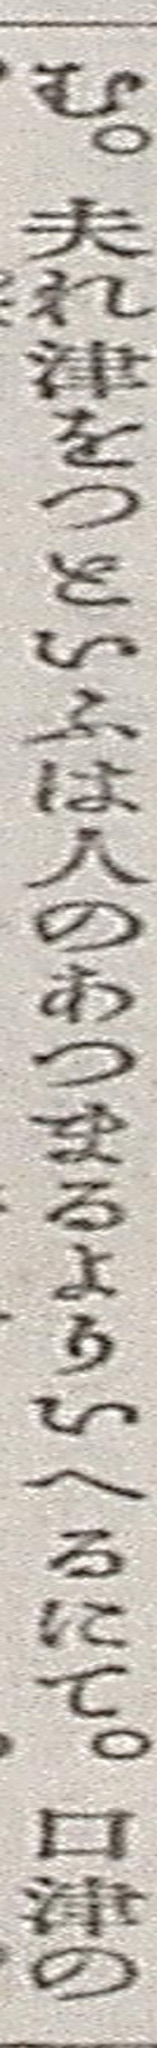む。夫れ津をつといふは人のあつまるよりいへるにて。口津の
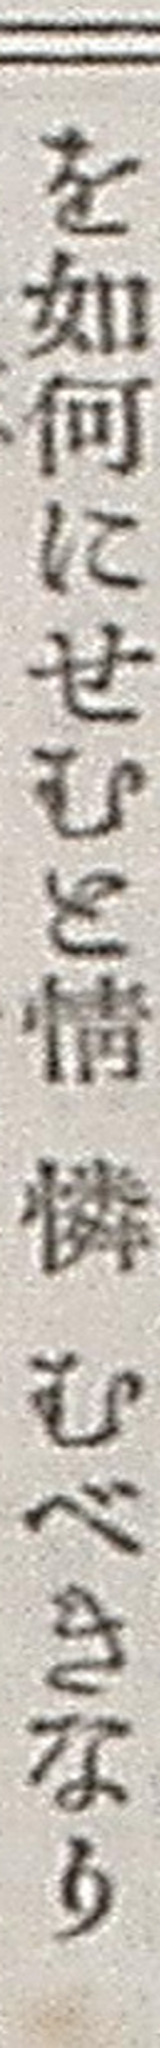を如何にせむと情憐むべきなり
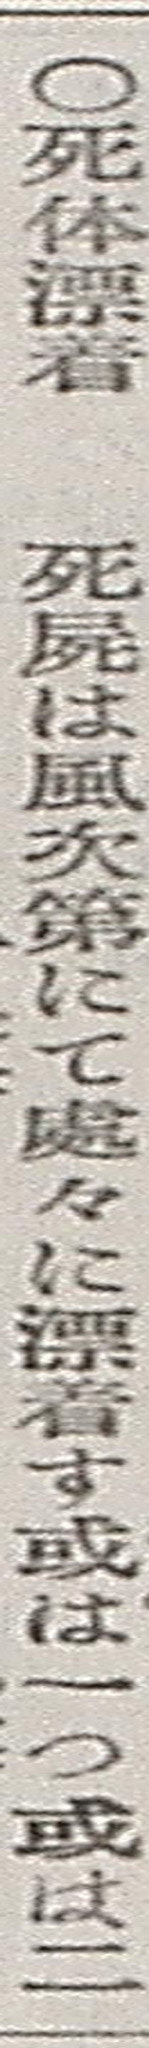○死体漂着死屍は風次第にて処々に漂着す或は一つ或は二
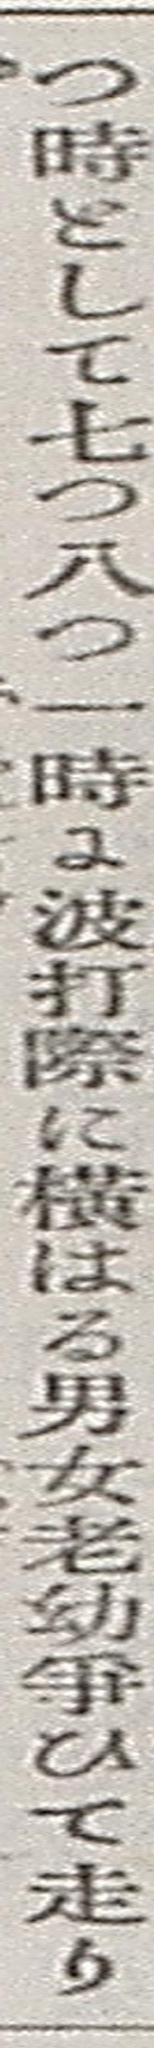つ時として七つ八つ一時に波打際に横はる男女老幼争ひて走り
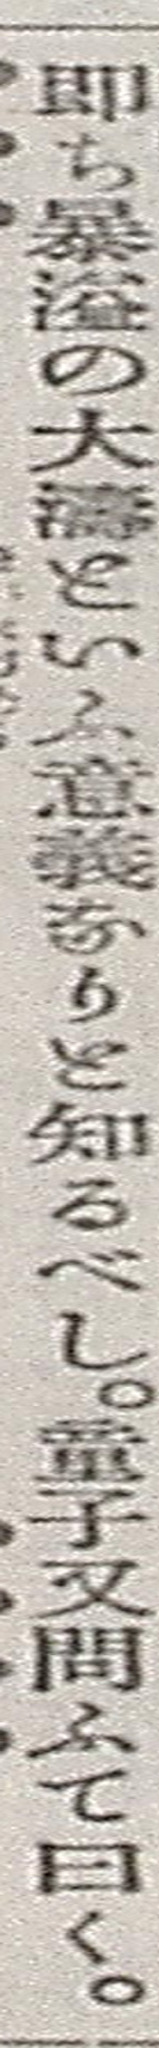即ち暴溢の大濤といふ意義なりと知るべし。童子又問ふて曰く。
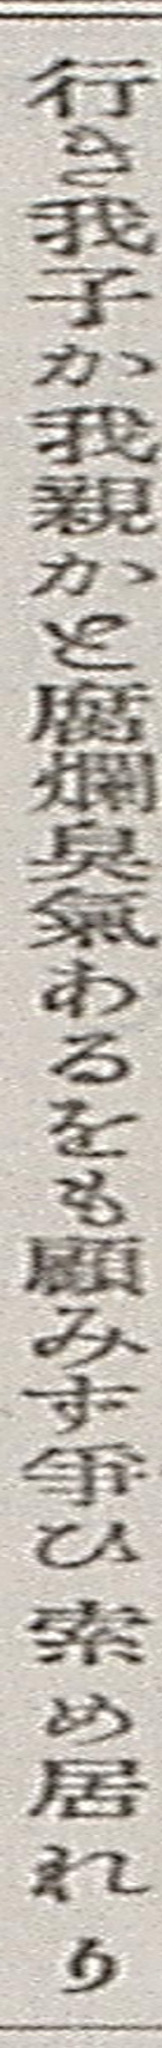行き我子か我親かと腐爛臭気あるをも顧みず争ひ索め居れり
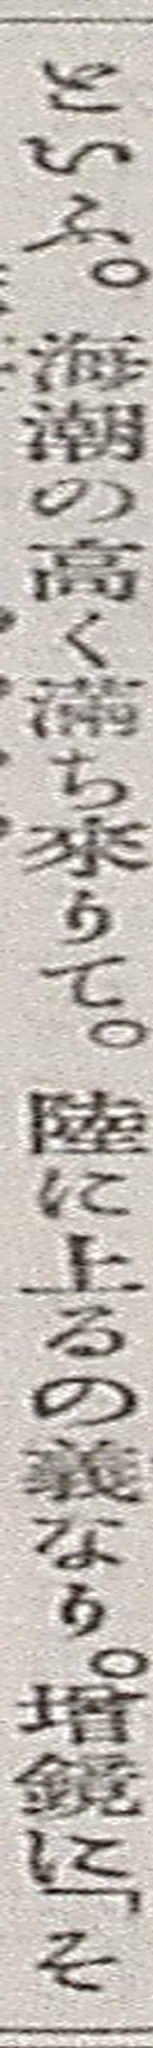といふ。海潮の高く満ち来りて。陸に上るの義なり。増鏡に「そ
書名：風俗畫報臨時増刊第百二十號　大海嘯被害録（下）
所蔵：東京大学地震研究所図書室 Earthquake Research Institute Library, The University of Tokyo, JAPAN
